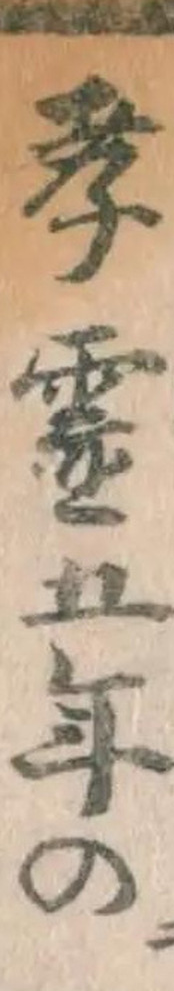孝霊五年の
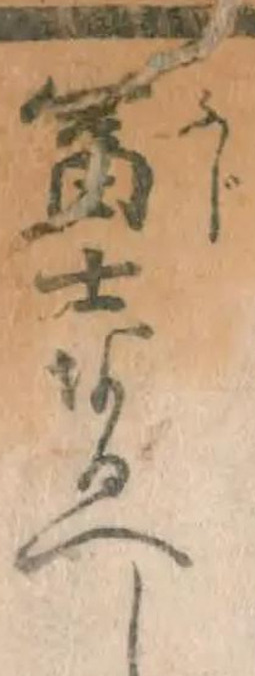冨士なるへし
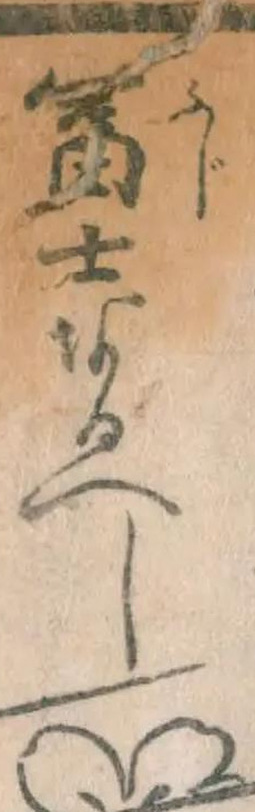冨士なるへし
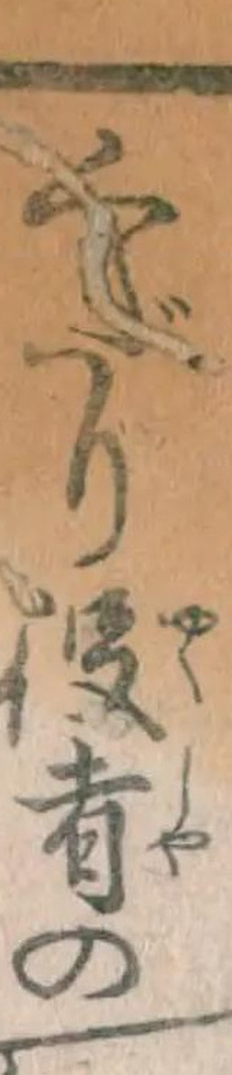くだり役者の
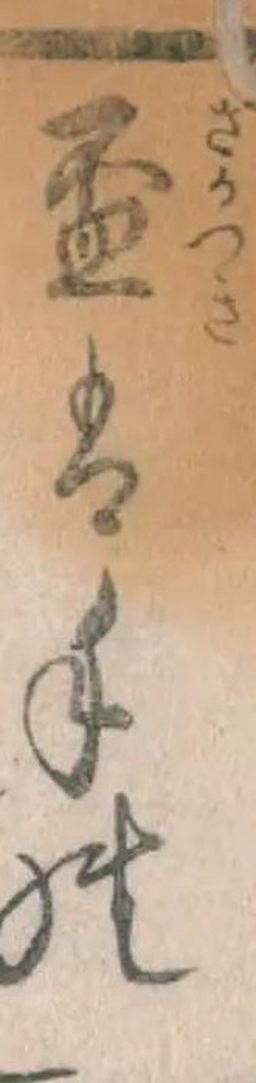盃は手の
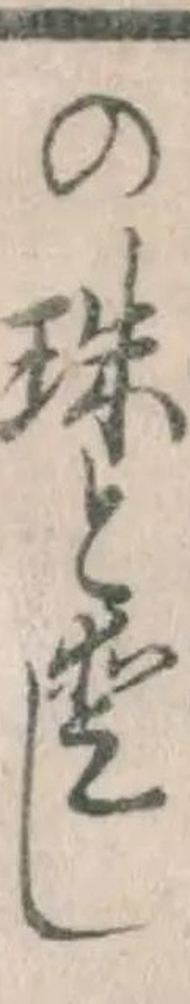の珠を愛し
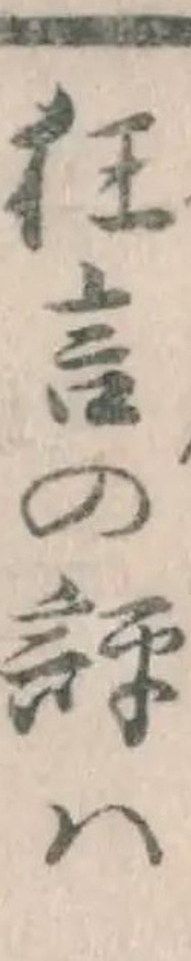狂言の評は
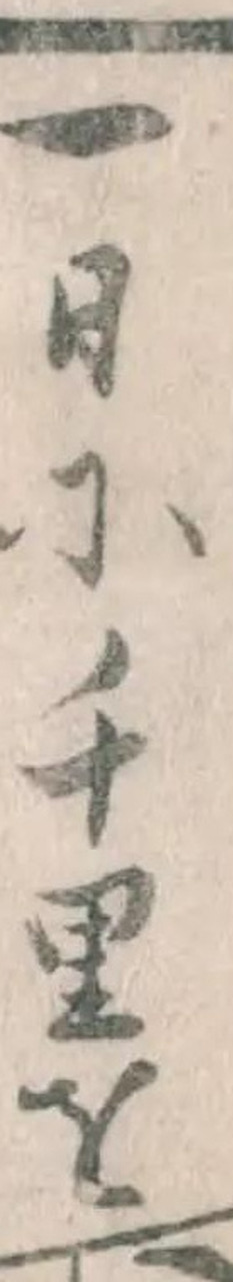一日に千里を
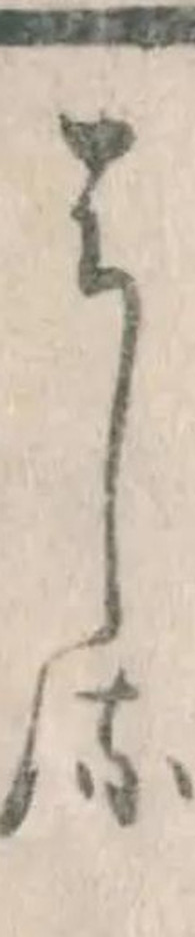はしる
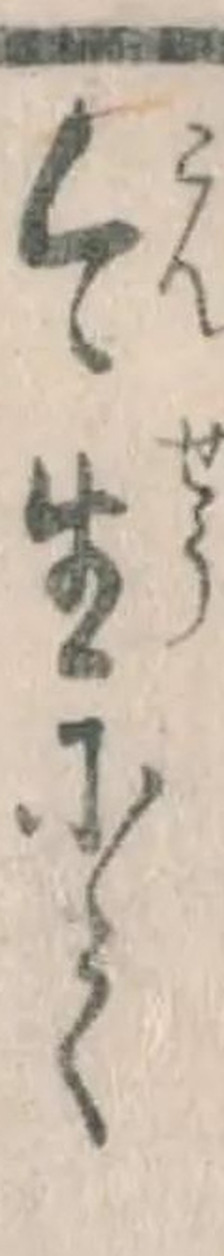今生にて
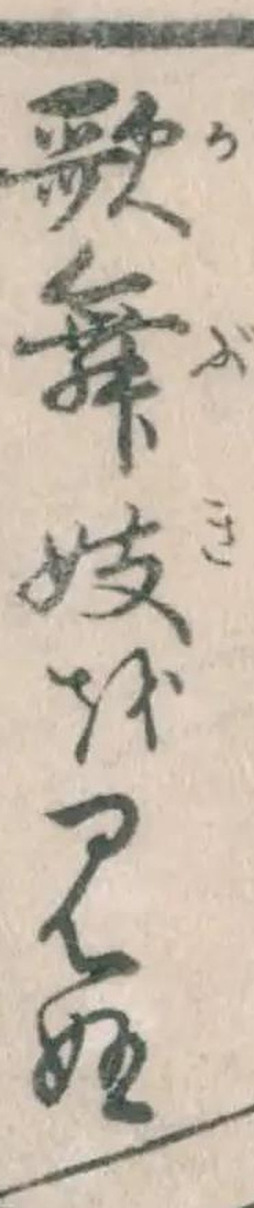歌舞伎を見ぬ
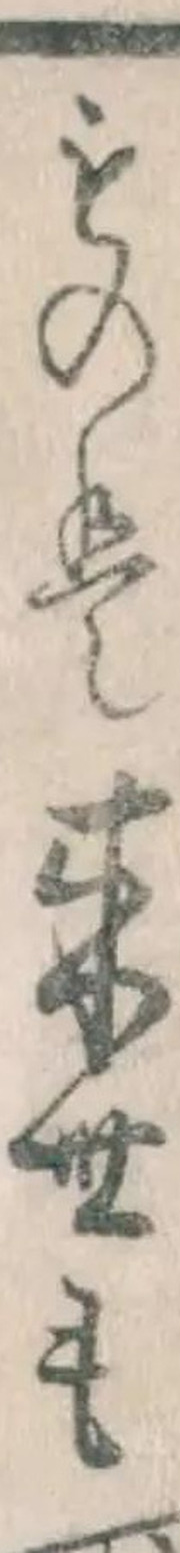ものは来世も
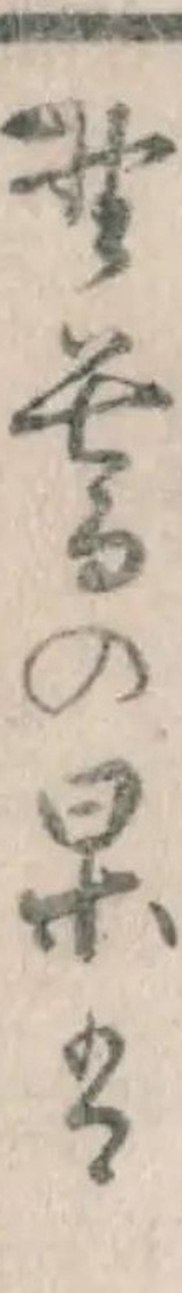野暮の果は
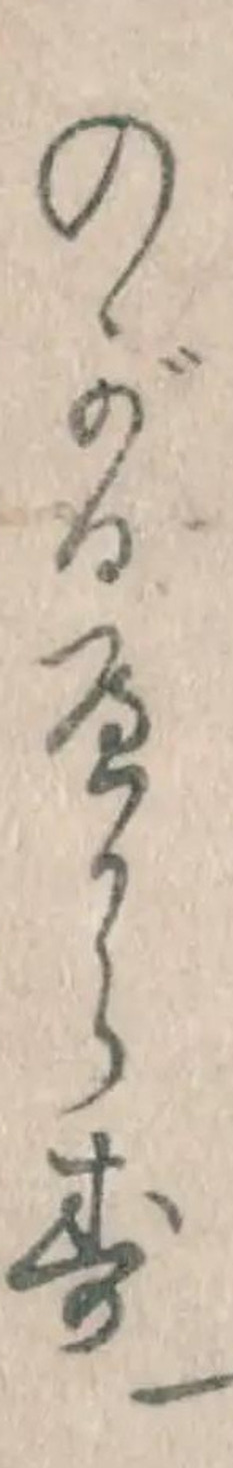のがるへからす

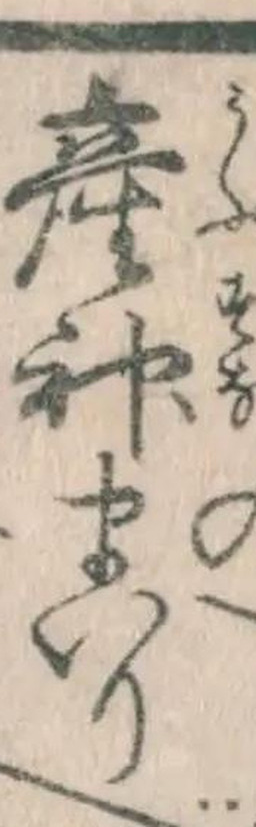産神まいり
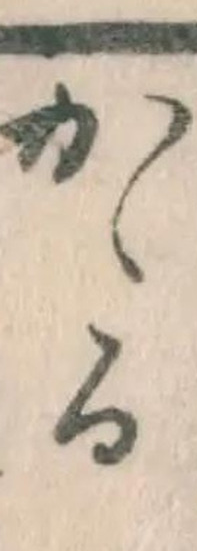かゝる
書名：絵本物見岡
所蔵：国立国会図書館 National Diet Library, JAPAN
